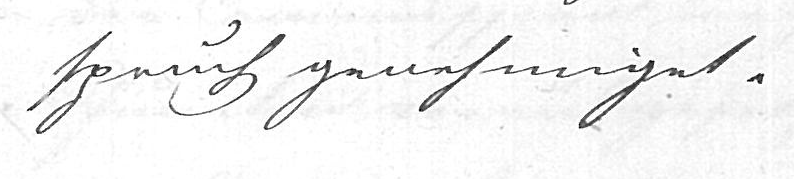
sprach genehmiget.
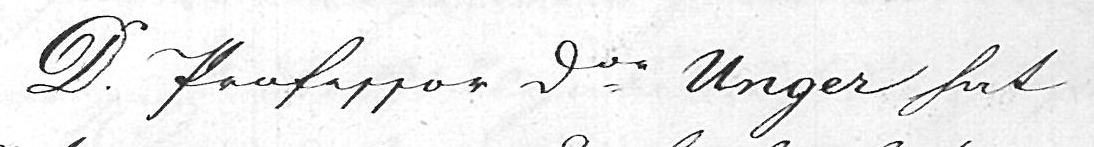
D. Professor Dor Unger hat
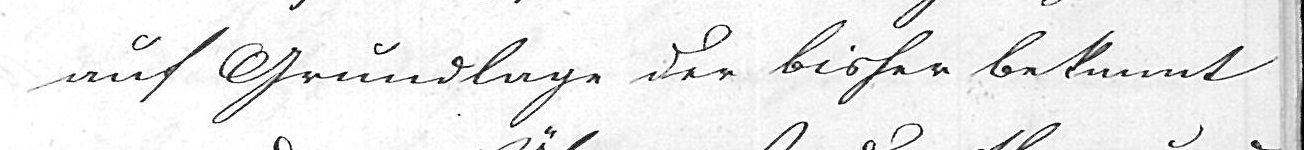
auf Grundlage der bisher bekannt
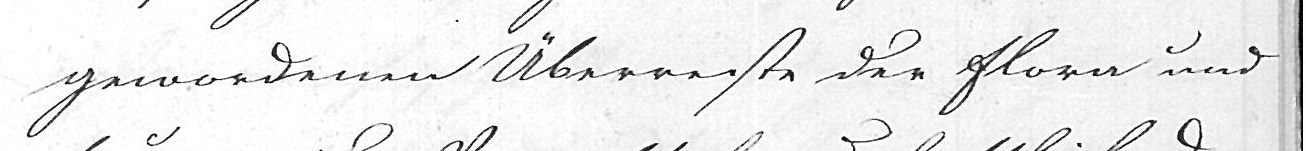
gewordenen Überreste der Flora und
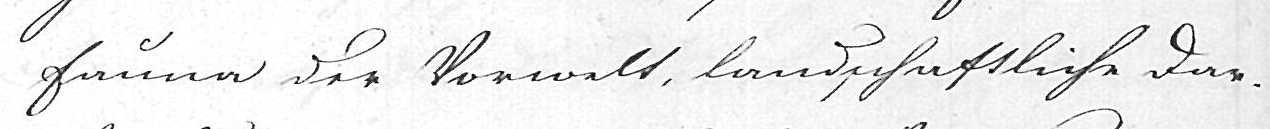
Fauna der Vorwelt, landschaftliche Dar-
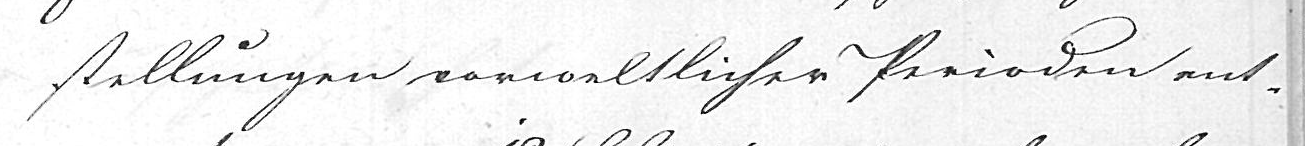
stellungen vorweltlicher Perioden ent-
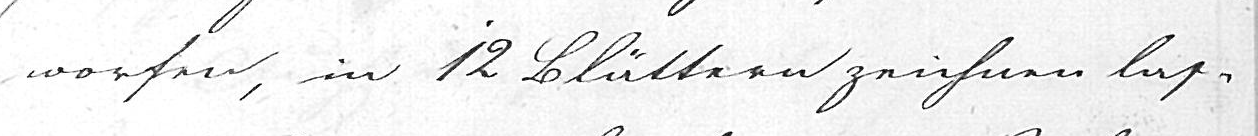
worfen, in 12 Blättern zeichnen las-
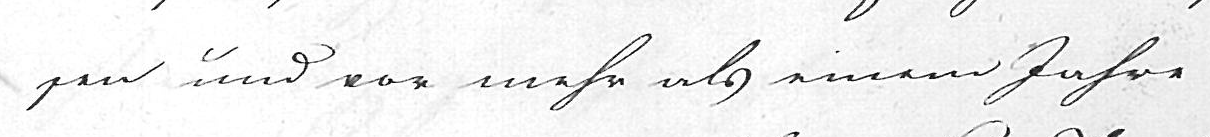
sen und vor mehr als einem Jahre
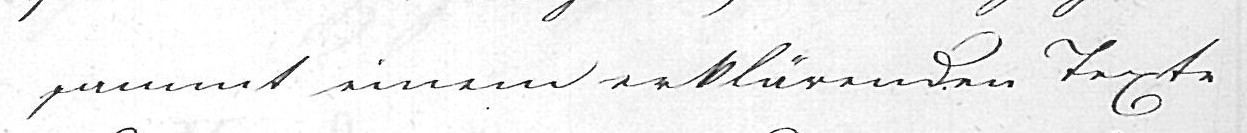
sammt einem erklärenden Texte
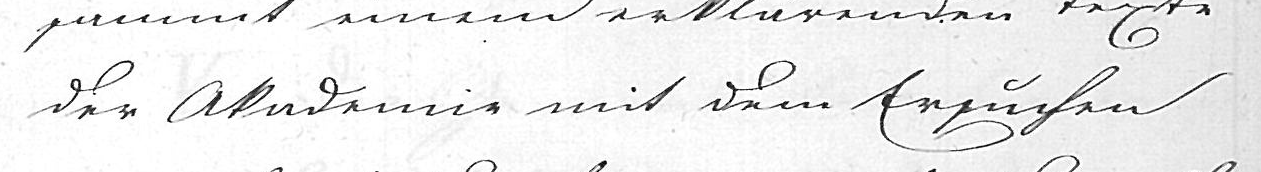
der Akademie mit dem Ersuchen
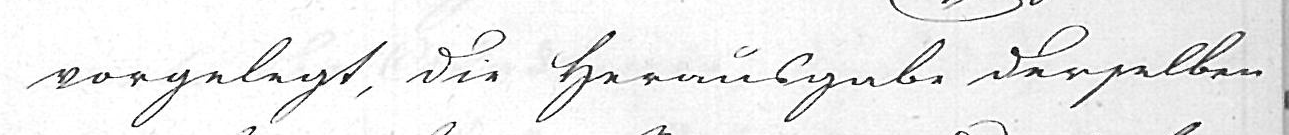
vorgelegt, die Herausgabe derselben
